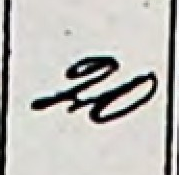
20
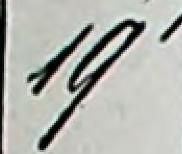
19
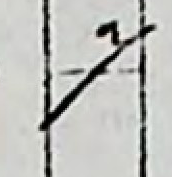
7
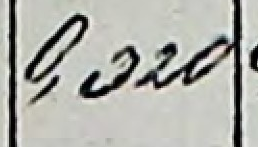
0,020
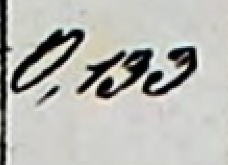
0,133
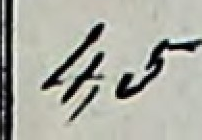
4,5
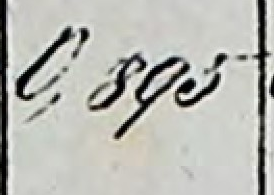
0,895
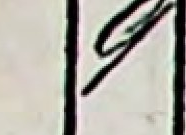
9
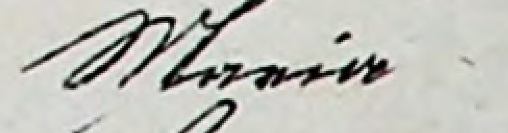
Maria
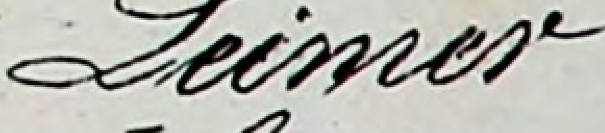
Leimer
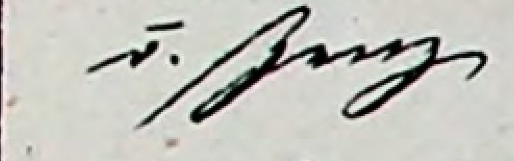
v. Zenz
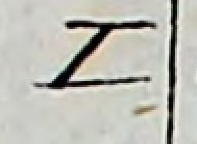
I
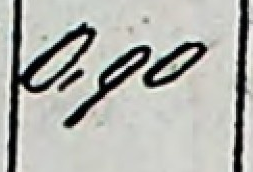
0,90
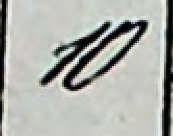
10
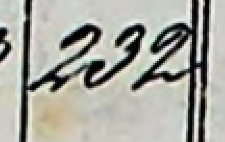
232
